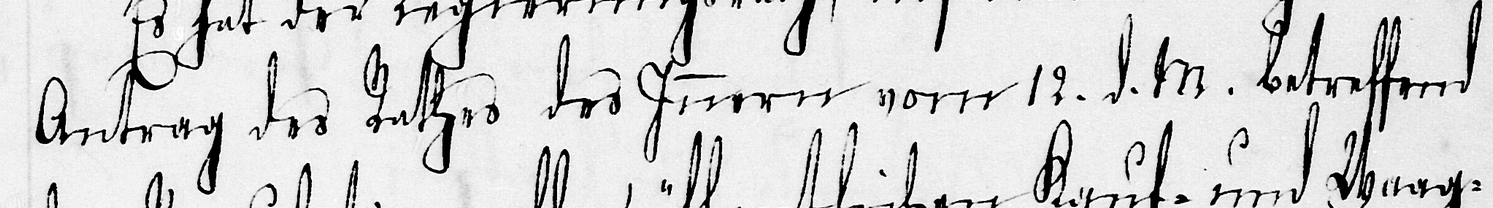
Antrag des Rathes des Innern vom 12. d. M. betreffend
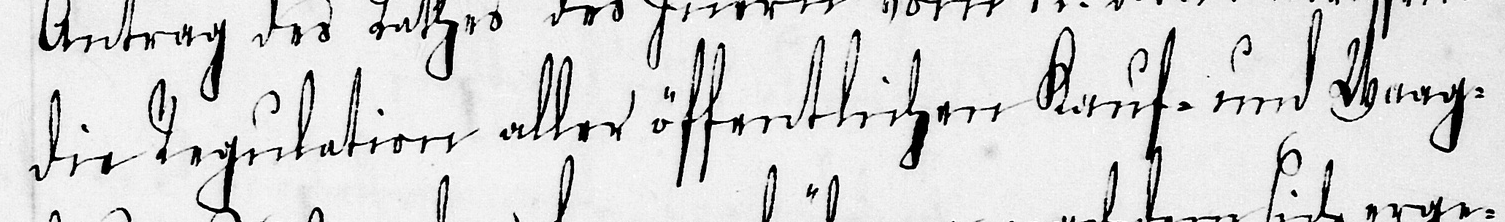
die Regulation aller öffentlichen Kauf- und Waag¬
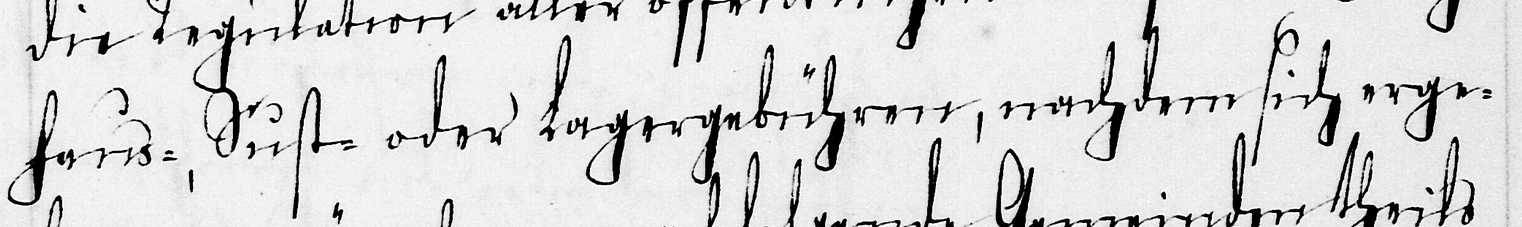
haus-, Sust- oder Lagergebühren, nachdem sich erge¬
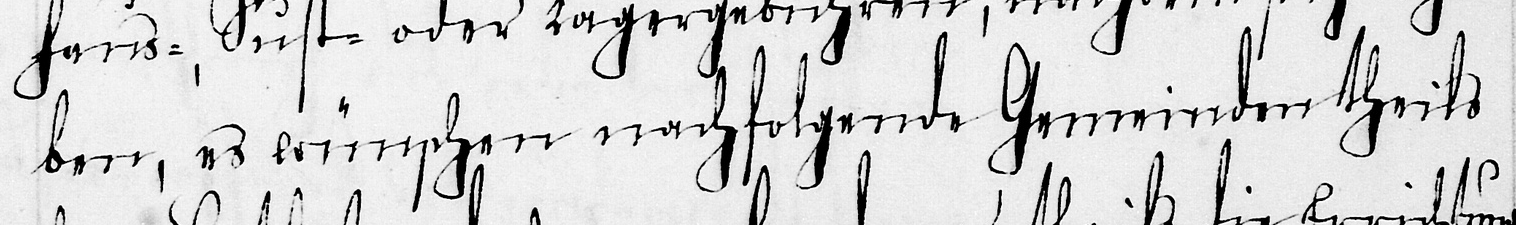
ben, es wünschen nachfolgende Gemeinden theils
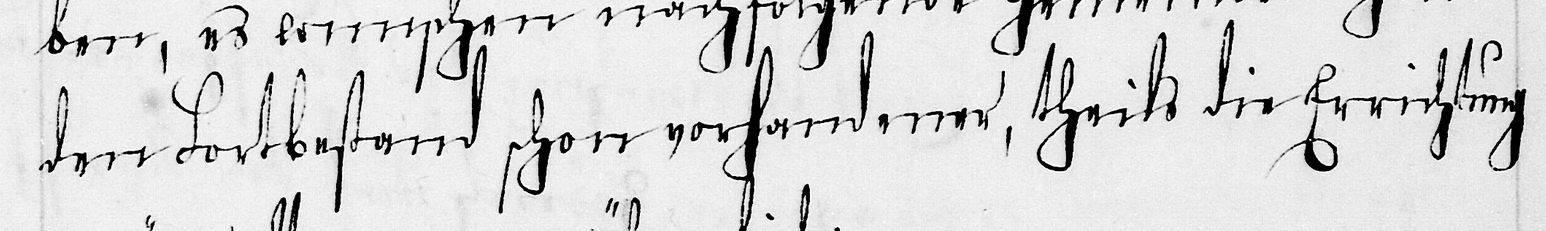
den Fortbestand schon vorhandener, theils die Errichtung
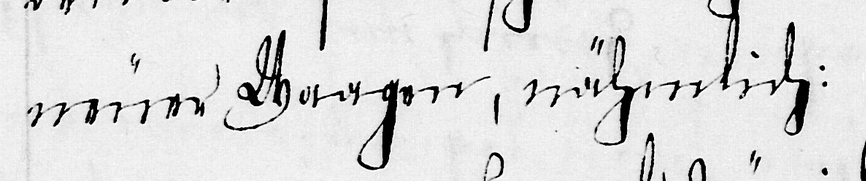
neuer Waagen, nähmlich:
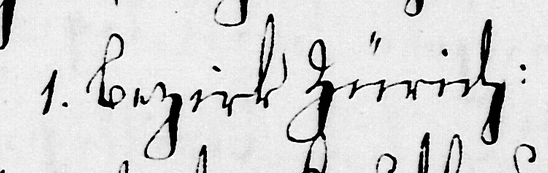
1. Bezirk Zürich:
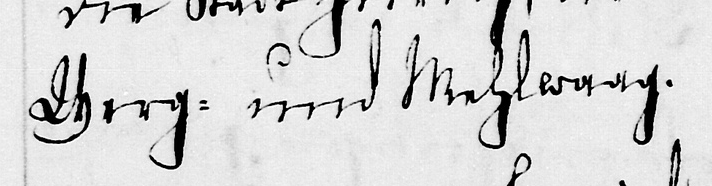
Werg- und Mehlwaag.
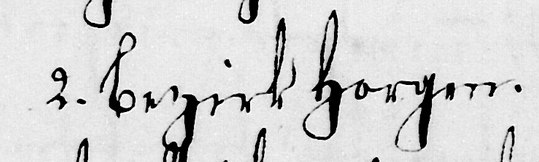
2. Bezirk Horgen.
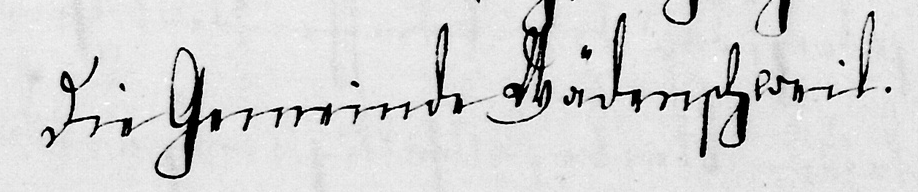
Die Gemeinde Wädenschweil.
